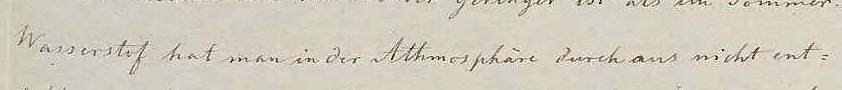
Wasserstof hat man in der Athmosphäre durch aus nicht ent-
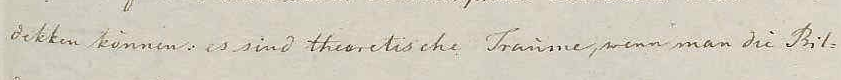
dekken können: es sind theoretische Träume, wenn man die Bil-
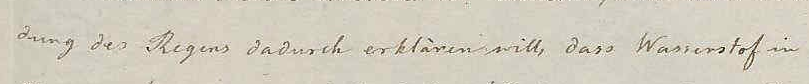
dung des Regens dadurch erklären will, dass Wasserstof in
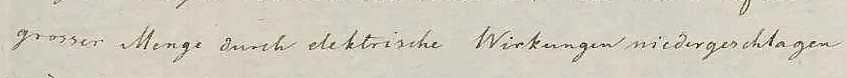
grosser Menge durch elektrische Wirkungen niedergeschlagen
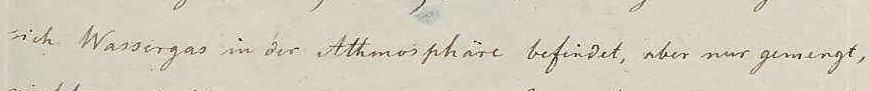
sich Wassergas in der Athmosphäre befindet, aber nur gemengt,
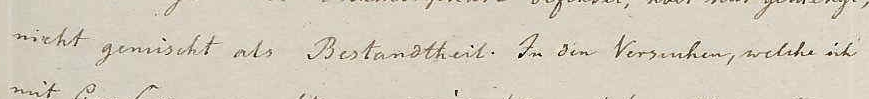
nicht gemischt als Bestandtheil. In den Versuchen, welche ich
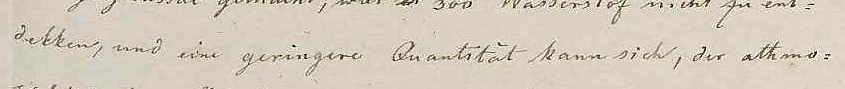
dekken, und eine geringere Quantität kann sich, der athmo-
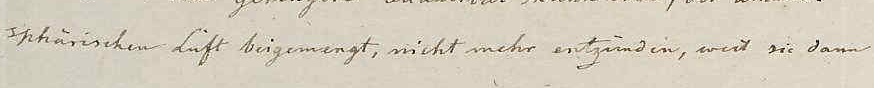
sphärischen Luft beigemengt, nicht mehr entzünden, weil sie
